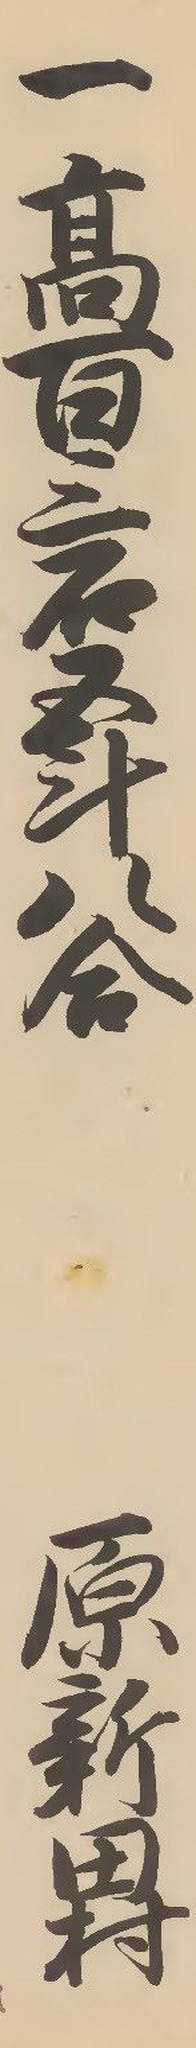一高百三石五斗八合原新田村
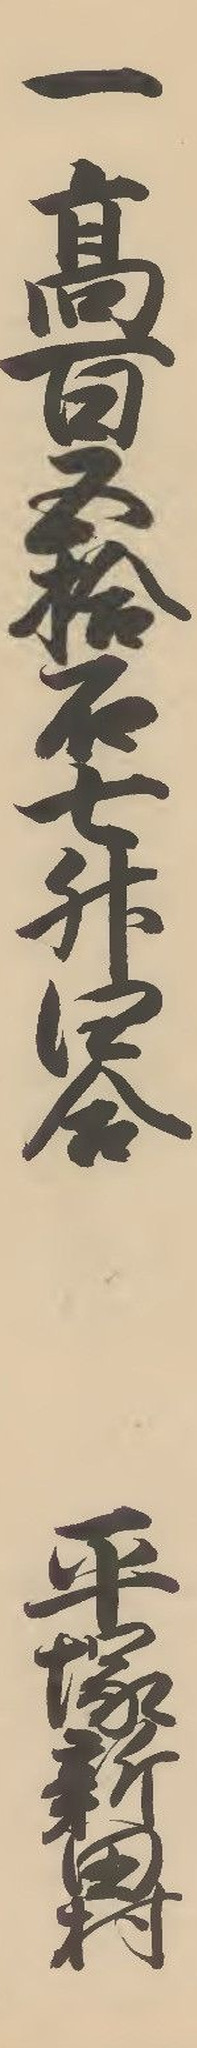一高百五拾石七升四合平塚新田村

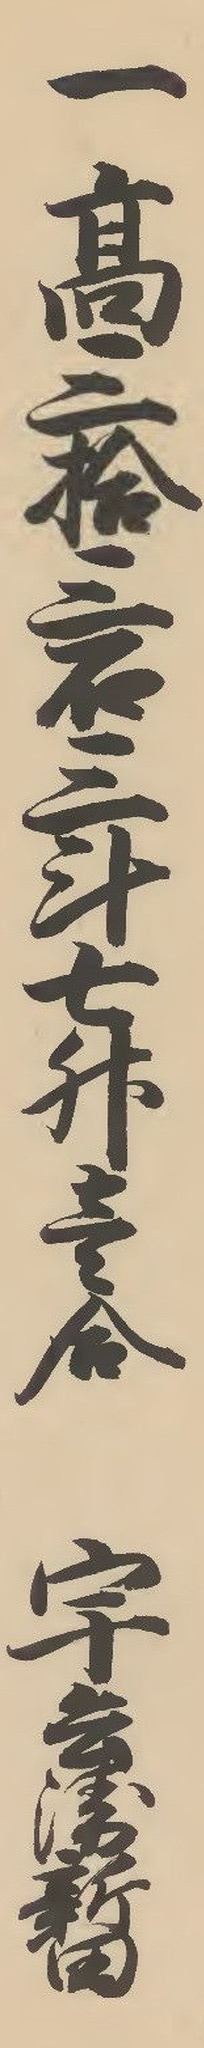一高三袷三石三斗七升壱合宇兵衛新田
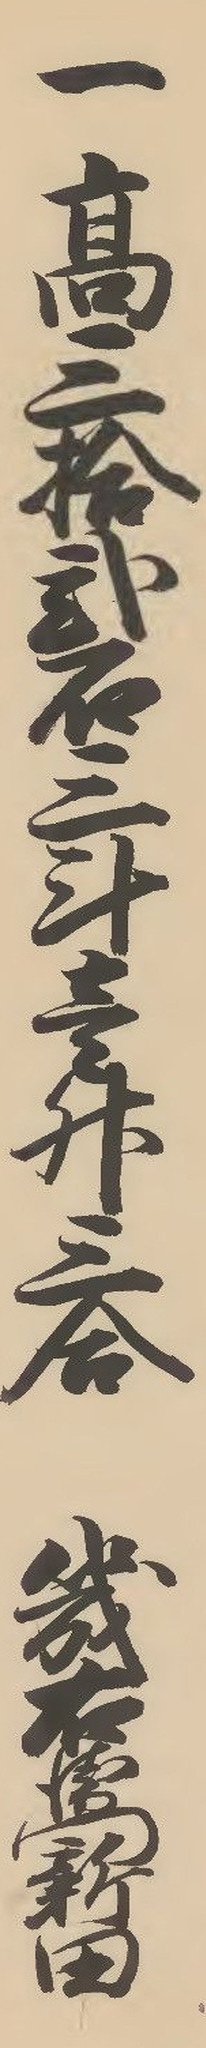一高三拾弐石三斗壱升三合幾右衛門新田
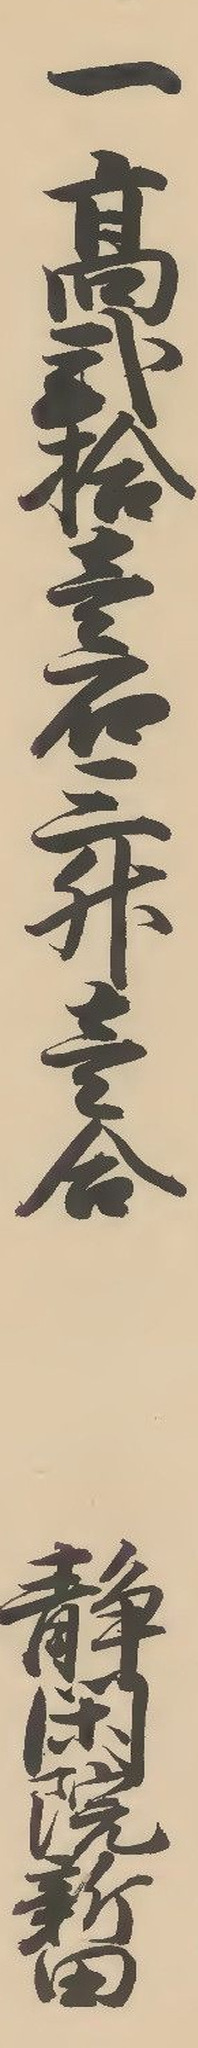一高弐拾壱石三升壱合静閑院新田
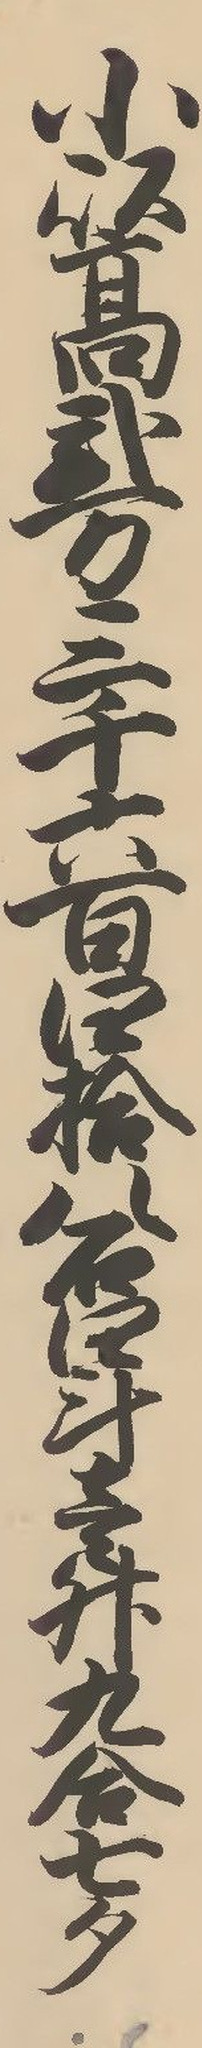小以高弐万三千六百四拾八石四斗壱升九合七勺
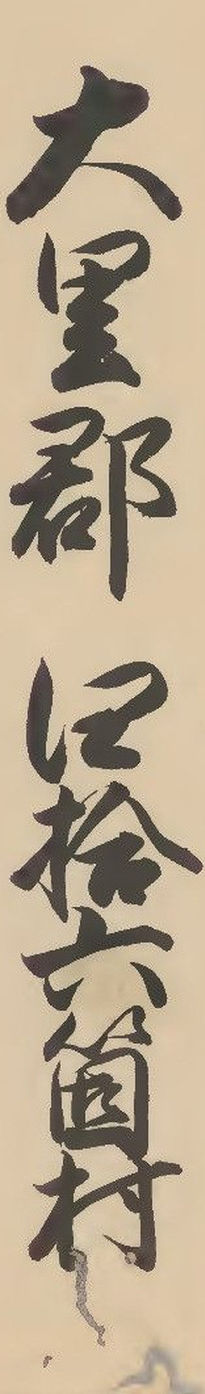大里郡四拾六箇村
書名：武蔵国郷帳　上
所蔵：国立公文書館 National Archives of Japan
